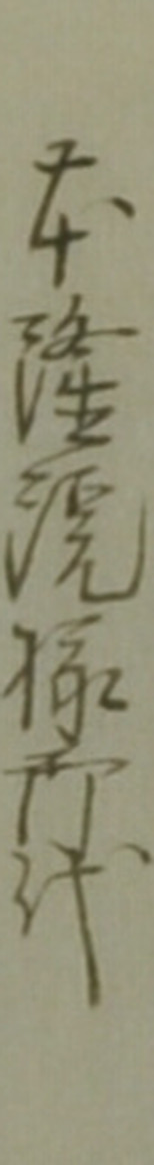本隆院様御代
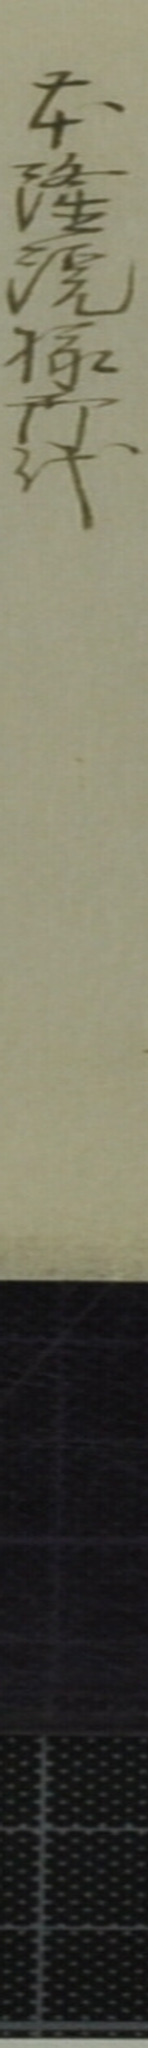本隆院様御代
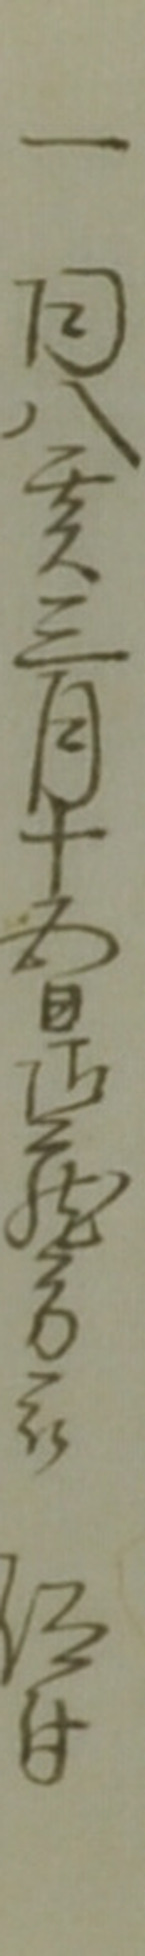一同八亥三月十五日御蔵方被仰付
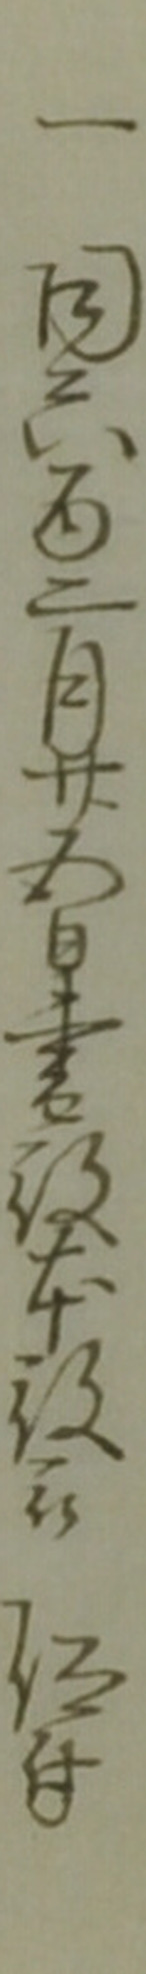一同六酉二月廿五日書役本役被仰付
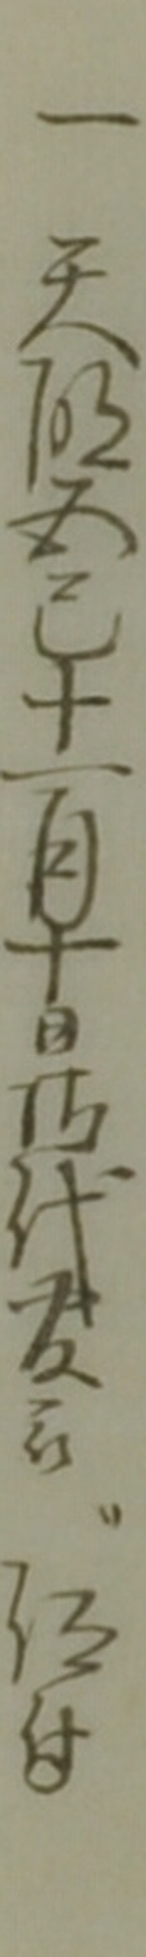一天明五巳十一月十日御代官被仰付
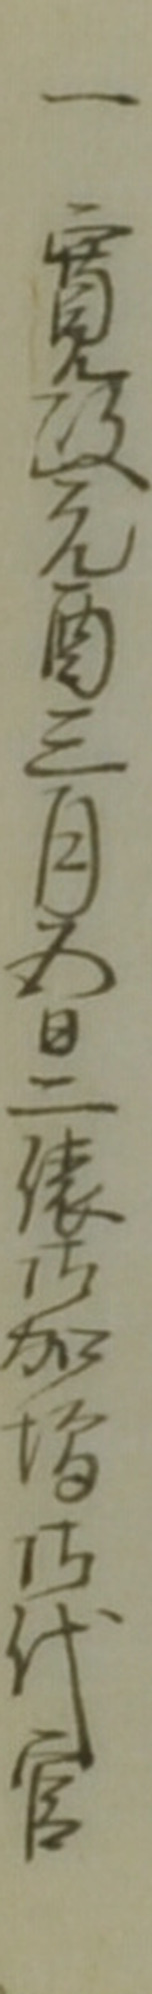一寛政元酉三月五日二俵御加増御代官
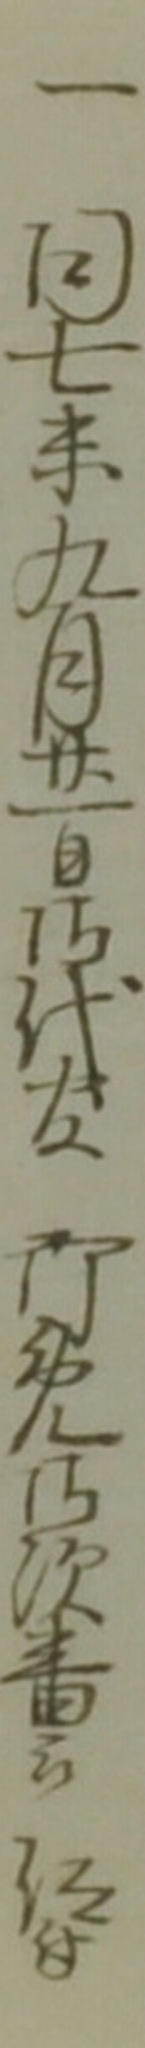一同七未九月廿一日御代官御免御次番被仰付
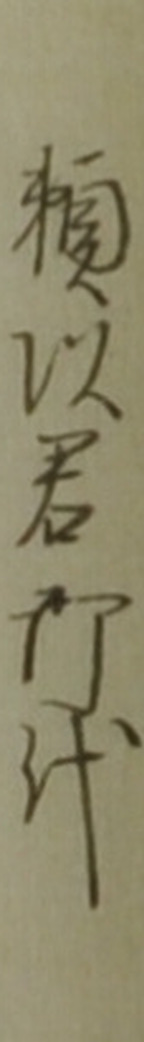頼以君御代
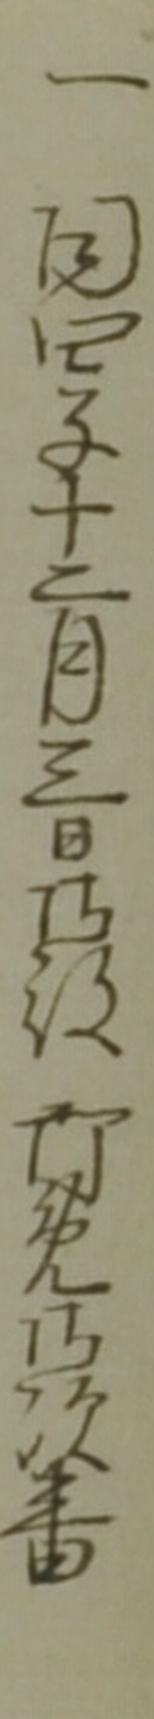一同四子十二月三日御役御免御次番
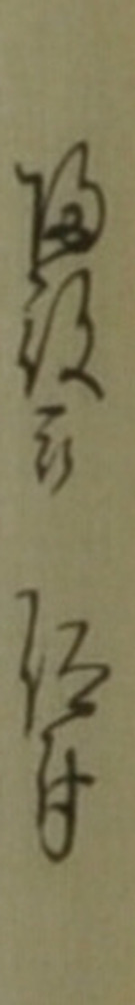帰役被仰付
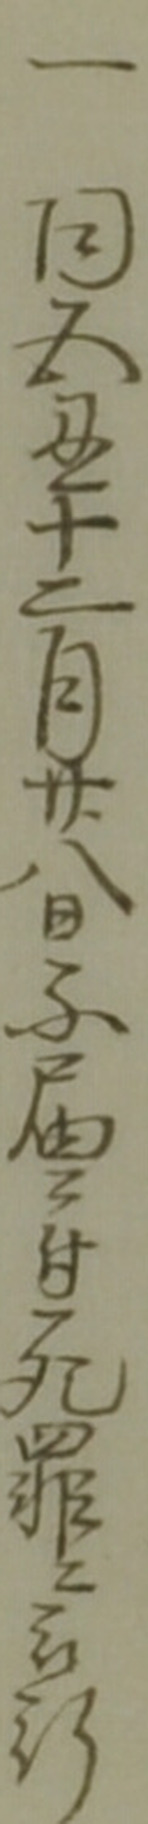一同五丑十二月廿八日不届ニ付死罪ニ被行
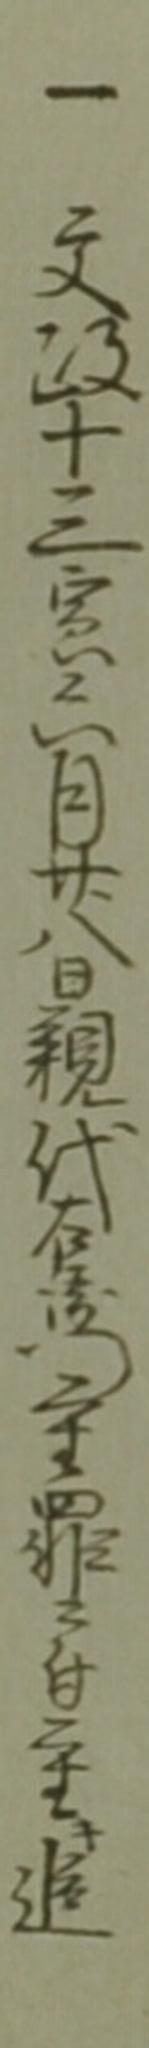一文政十三寅六月廿八日親代右衛門重罪ニ付重キ追
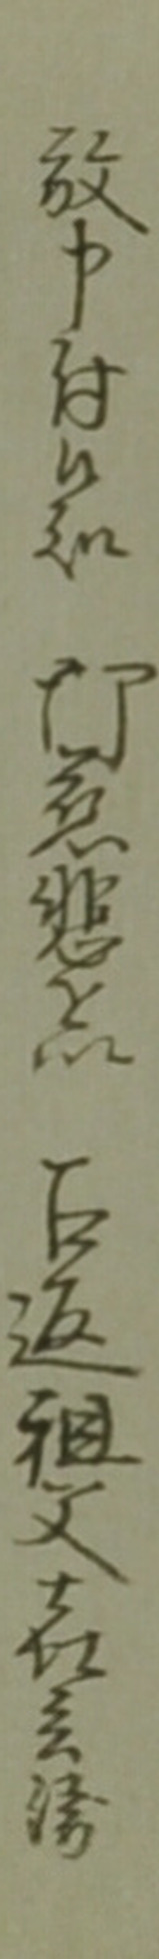放申付候処御慈悲を以召返祖父喜兵衛
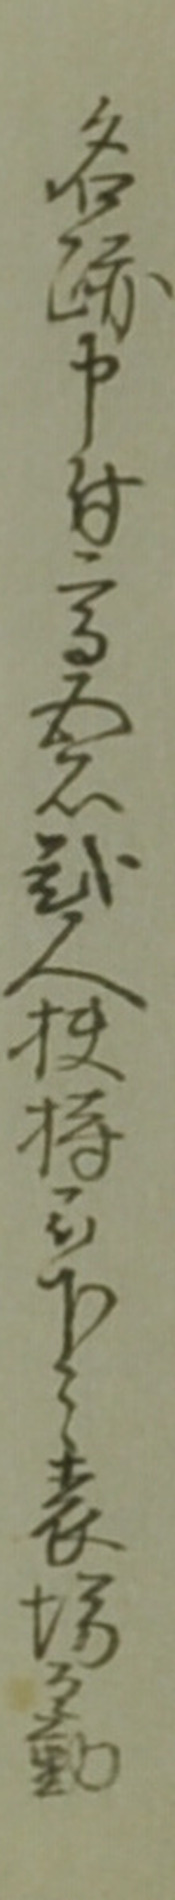名跡申付高五石弐人扶持被下之表坊主勤
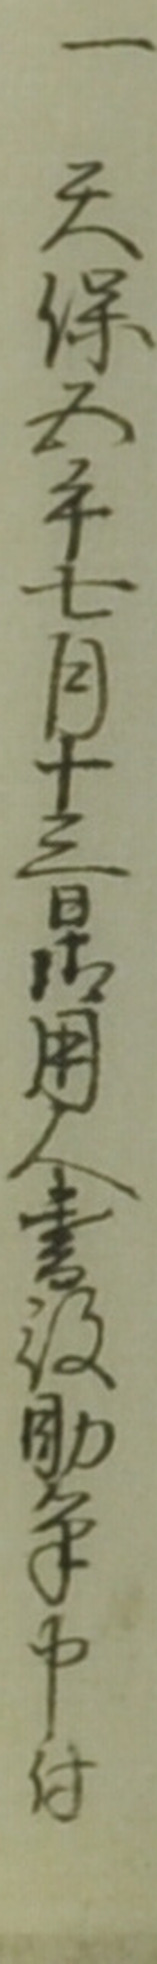一天保五午七月十三日御用人書役助筆申付

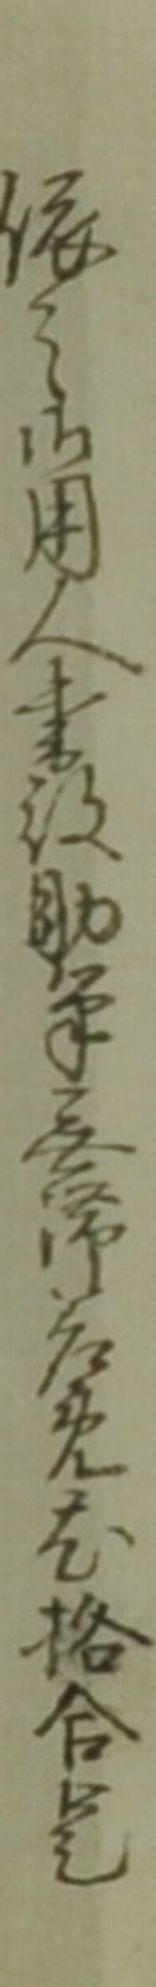依之御用人書役助筆無滞差免尤格合是
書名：無足諸士勤仕録（九）
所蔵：伊那市立高遠町図書館・合同会社AMANE
